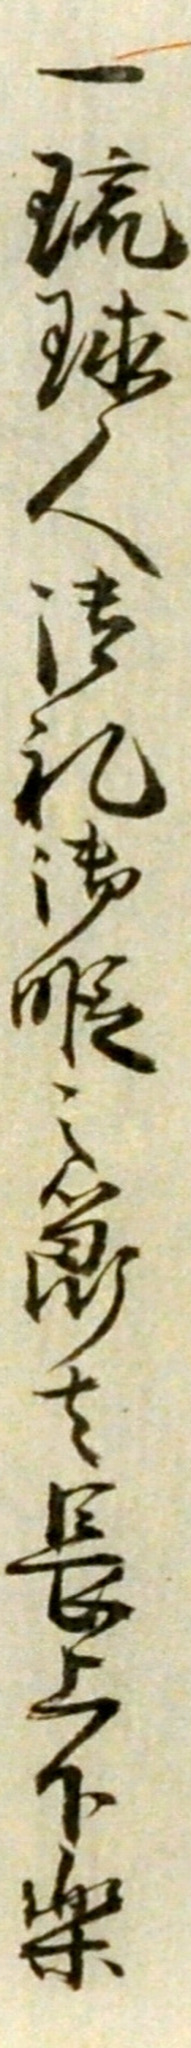一琉球人御礼御暇之節は長上下楽
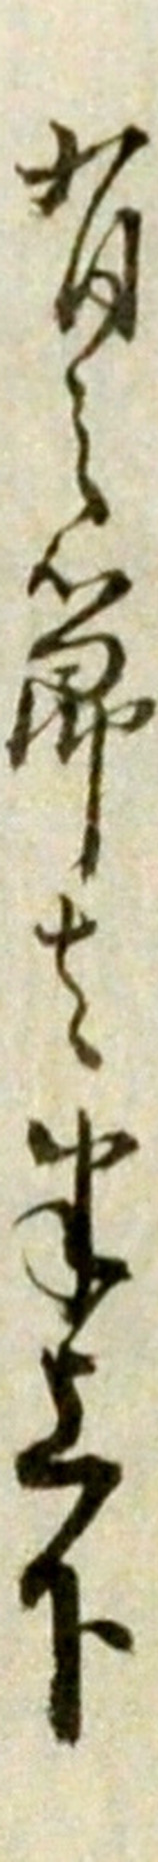有之節は半上下
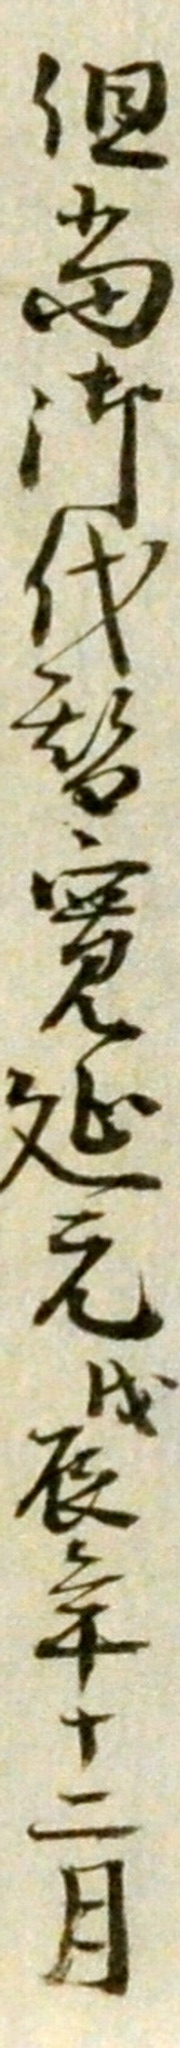但当御代替寛延元戊辰年十二月
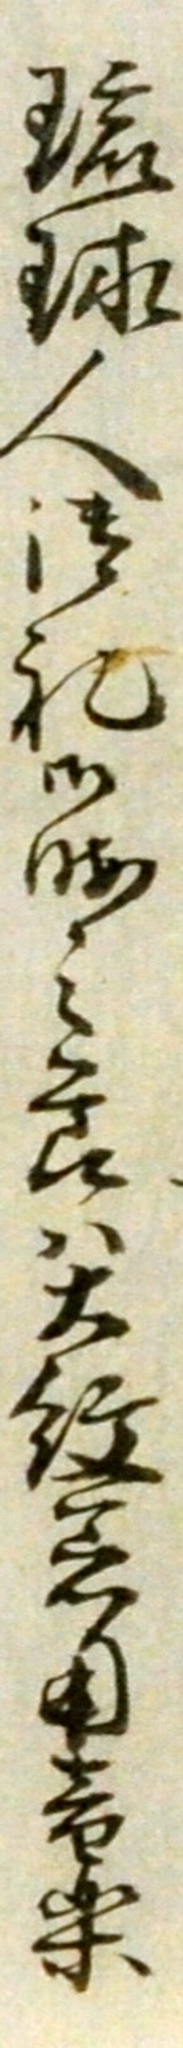琉球人御礼御暇之節は大紋着用音楽
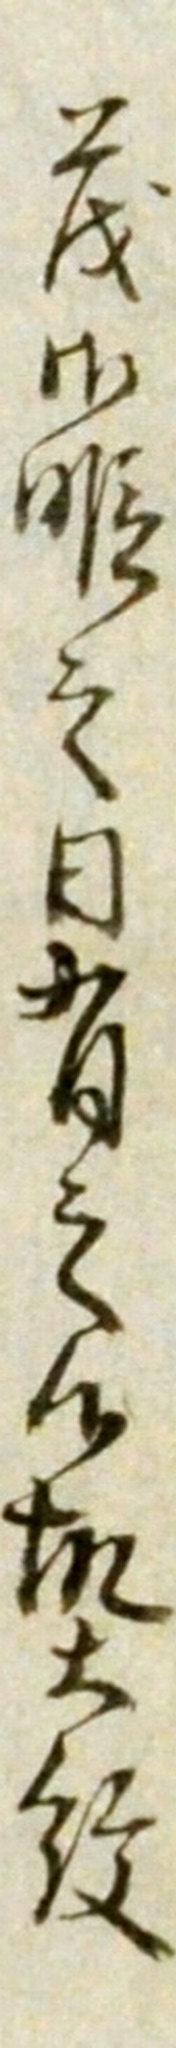も御暇之日有之候故大紋
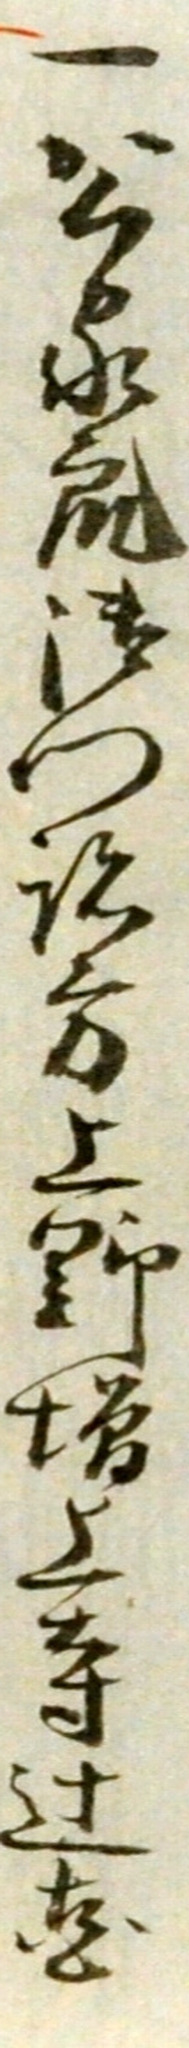一公家衆御門跡方上野増上寺辻固
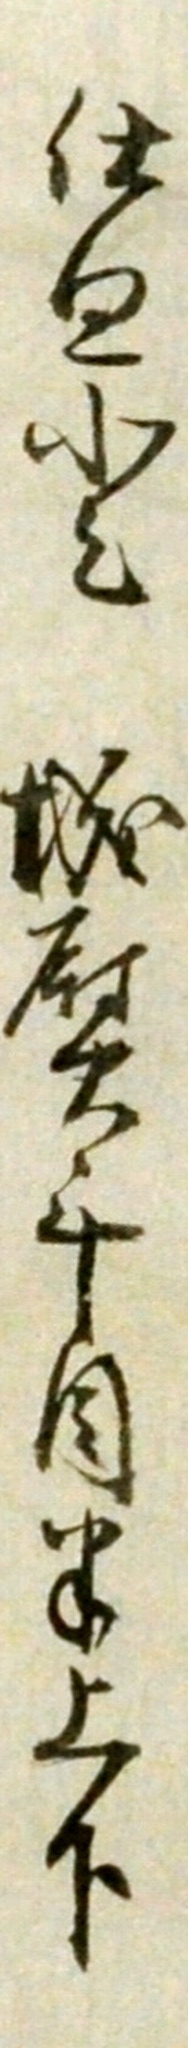仕廻登城熨斗目半上下
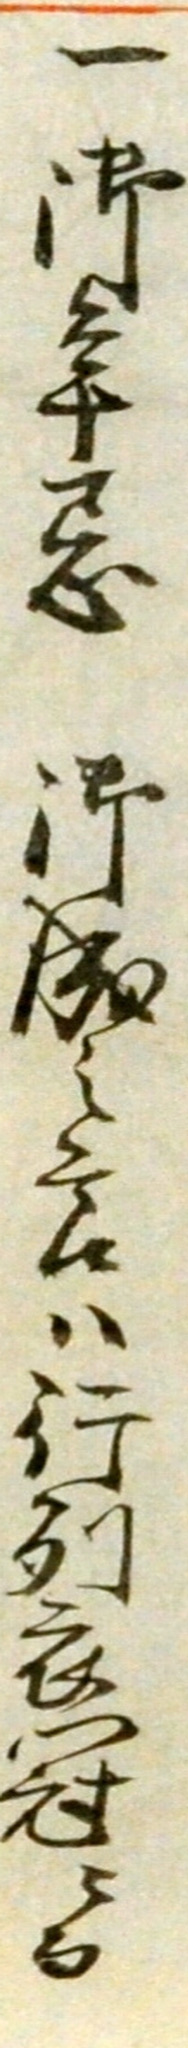一御年忌御成之節は行列衣冠にて
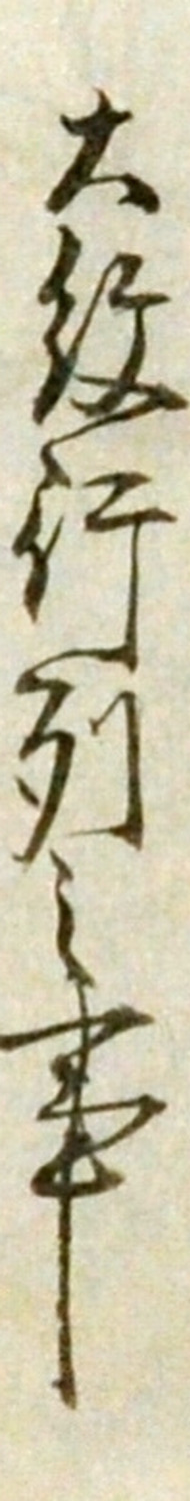大紋行列之事
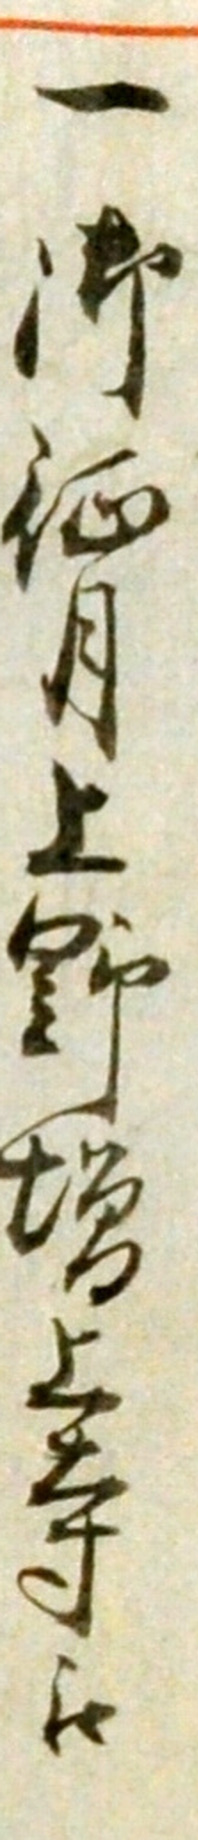一御征月上野増上寺え
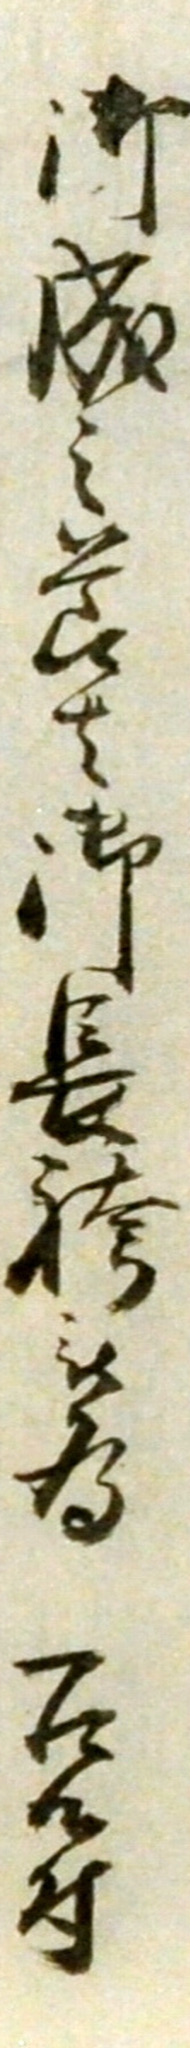御成之節は御長袴被為召候付
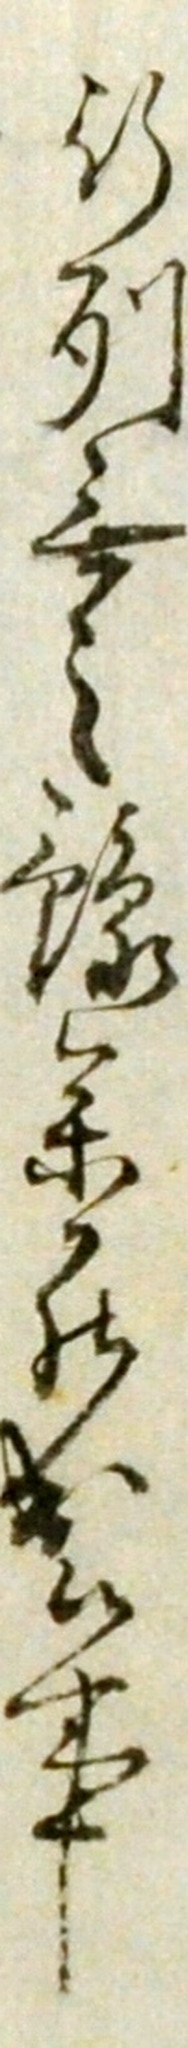行列無之予参罷出候

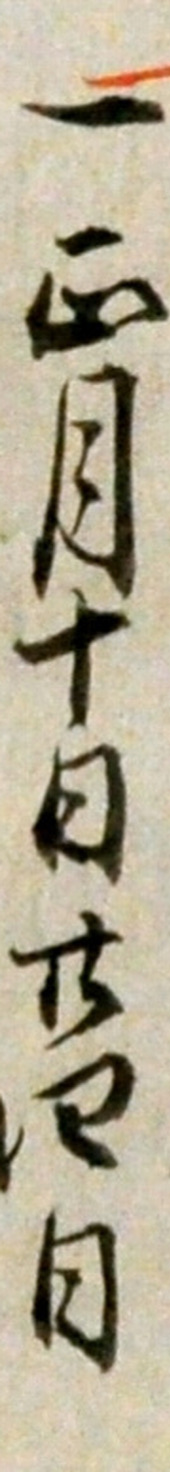一正月十日廿四日
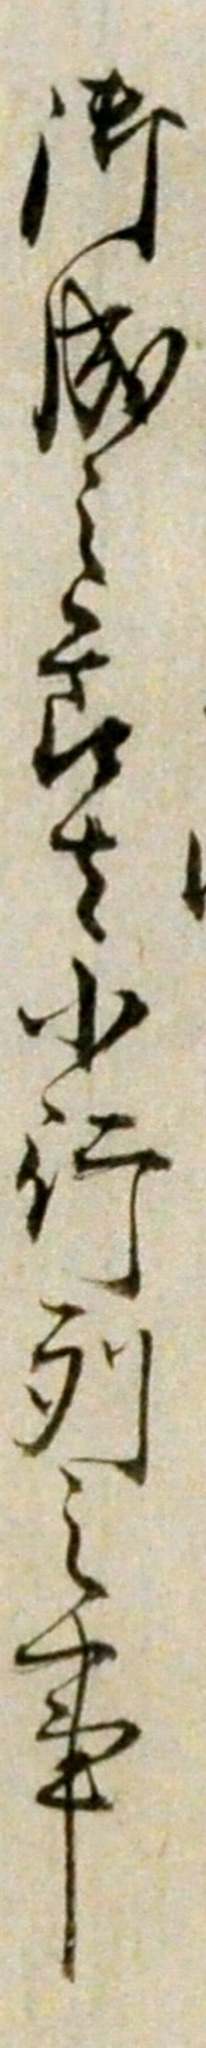御成之節は小行列之事
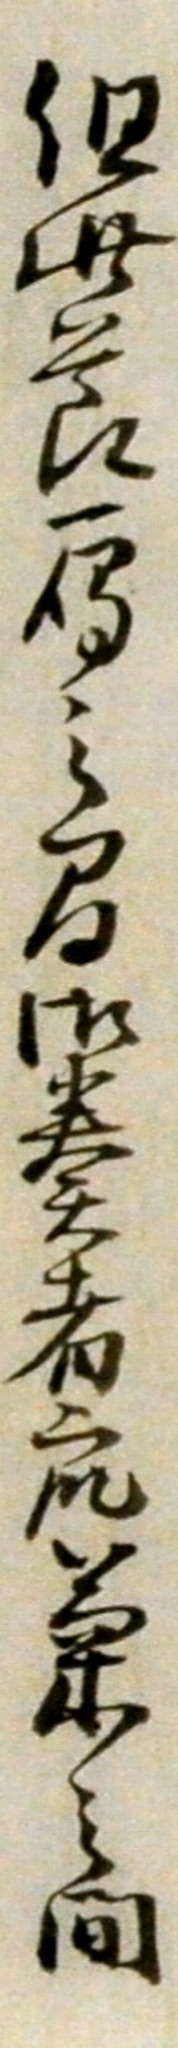但此節雁之間御奏者衆菊之間
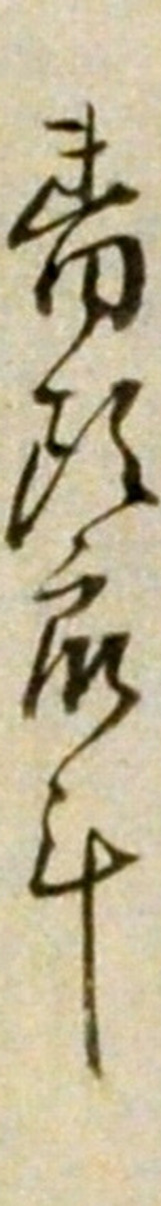番頭衆斗
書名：申合帳〔一括〕
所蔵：伊那市立高遠町図書館・合同会社AMANE
